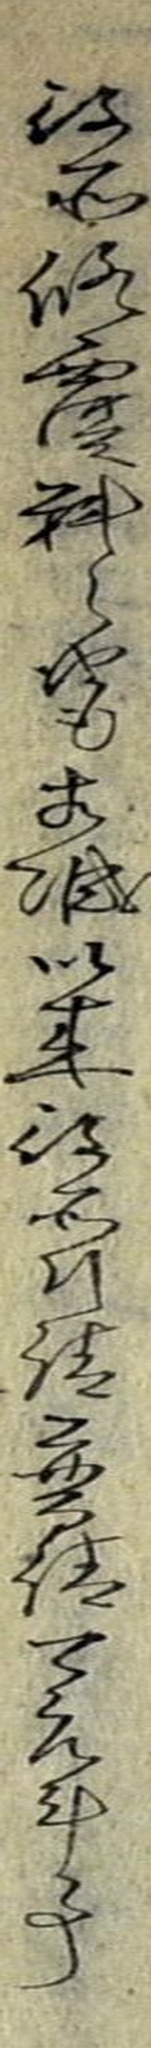役所修覆料之儀も相減以来役所引請普請可取計事
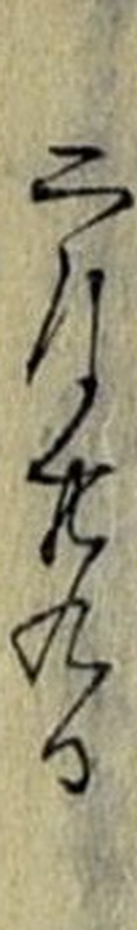二月廿九日
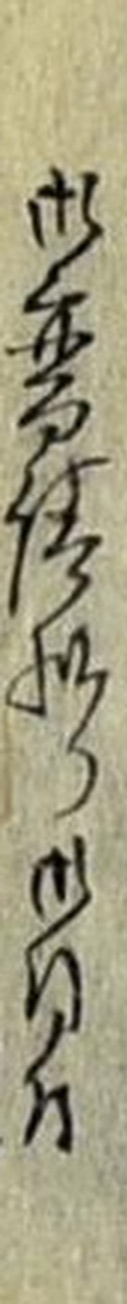御普請掛り御目付
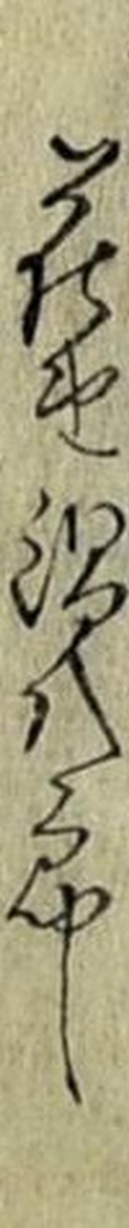荻野鍋八郎
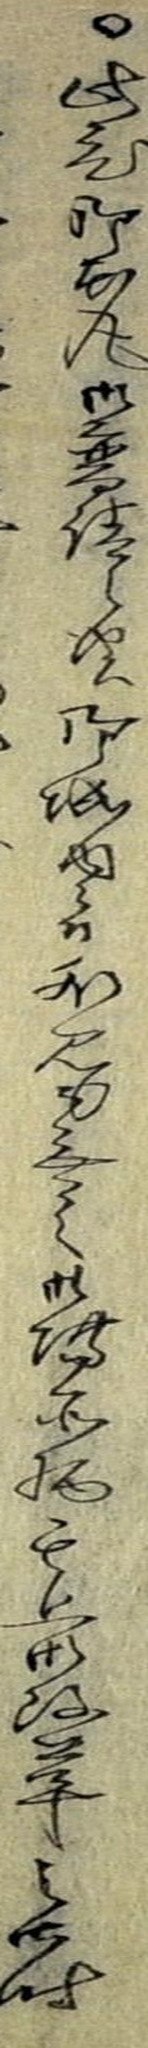○此度御本丸御普請之儀ハ御城内ニ付外見も無之御場所柄其上御改革之御時
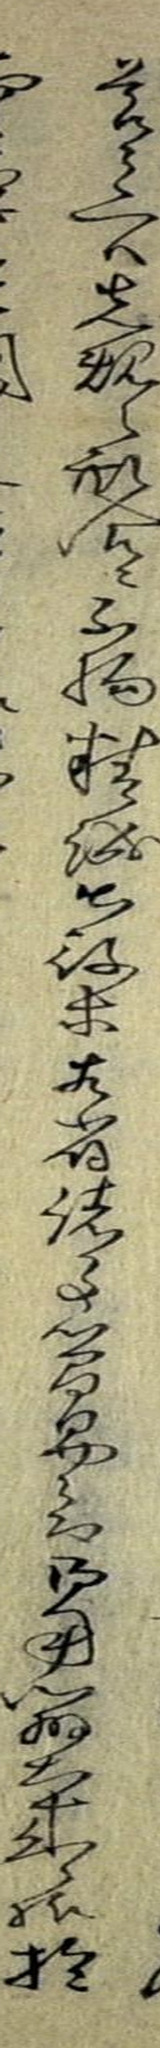節ニ候へハ先規之形合ニ不拘精誠出役等相省諸事簡易ニ而御用弁出来候様於
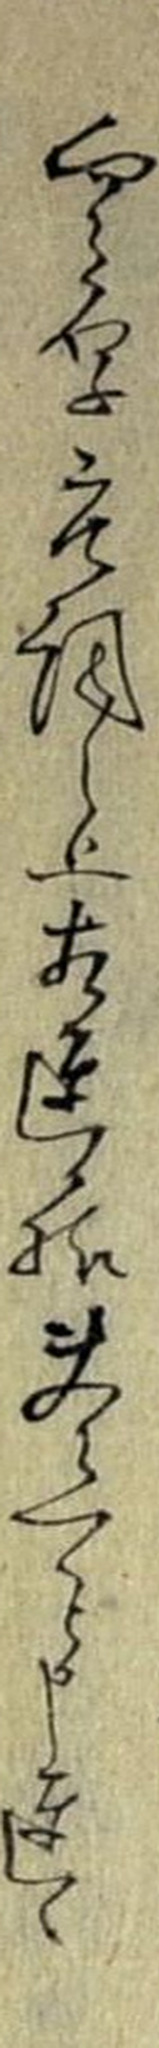向々厚取調之上相達候様夫々可申達候
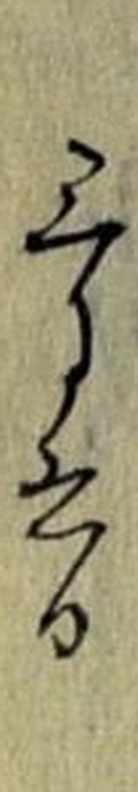三月六日
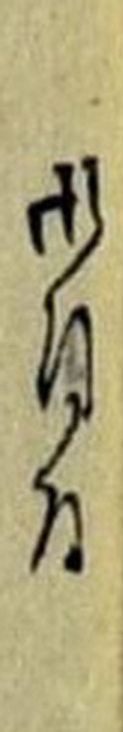御目付
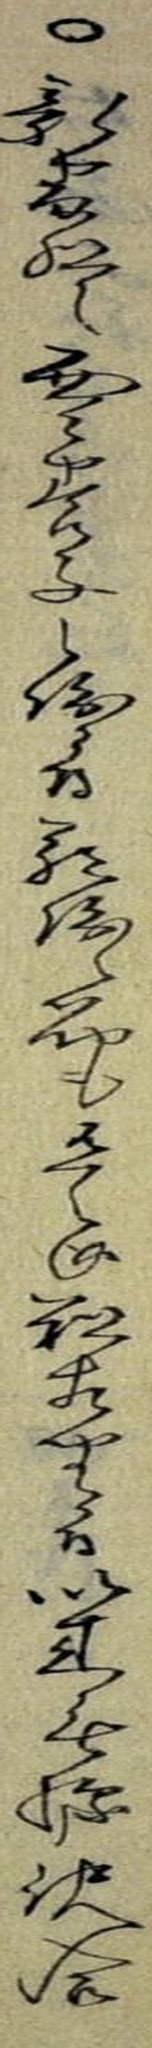○新番組之面々養子之儀ニ付難儀之筋も有之趣粗相聞候ニ付以来無拠訳合
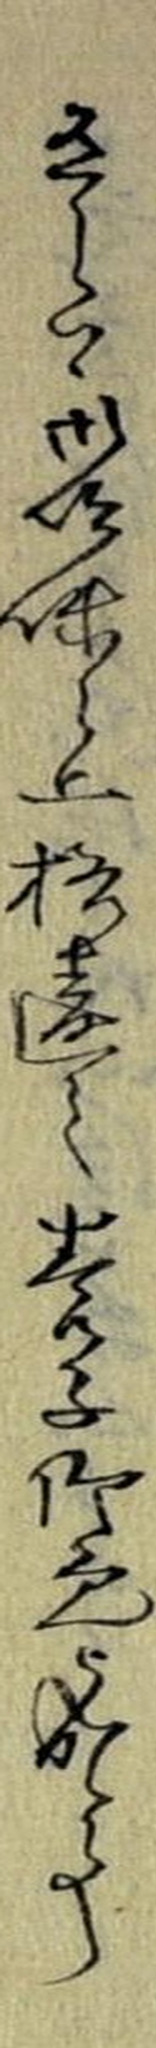有之候ハヽ御吟味之上格違之養子御免被成候事
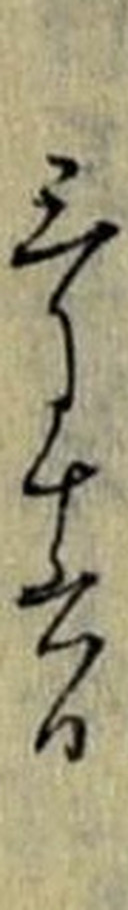三月十六日
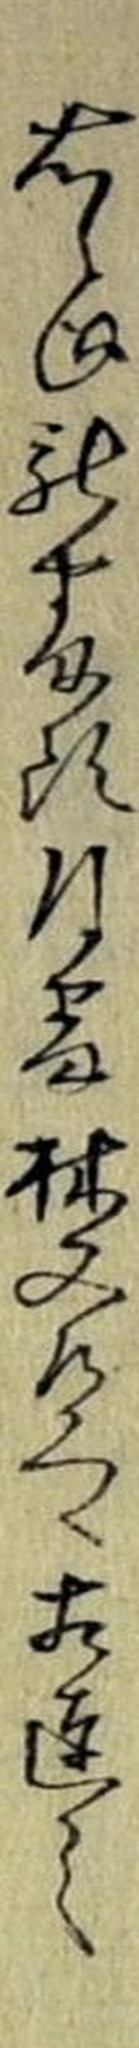右之趣新番頭月番林又左衛門へ相達之
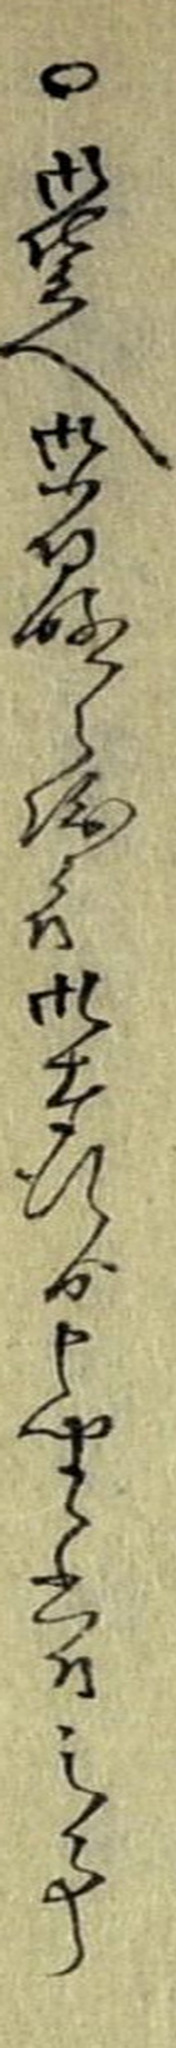○御貸人御省略之儀ニ付御奉行ゟ申聞候書付之事
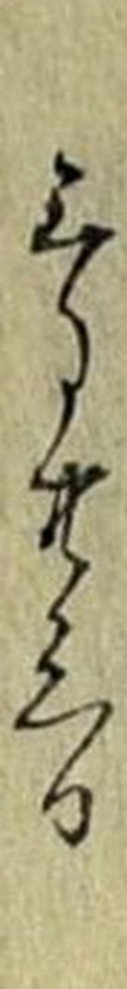三月廿三日
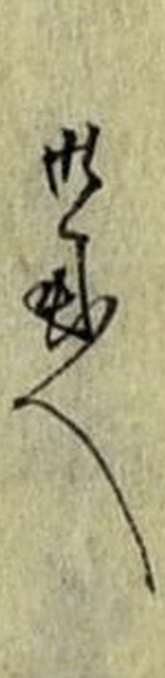御用人
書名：命令之部 五
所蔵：福井県文書館 Fukui Prefectural Archives
